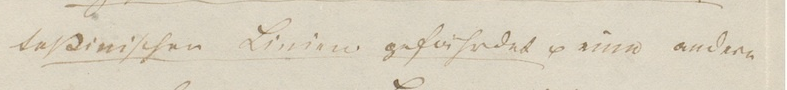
teßinischen Linien gefährdet & eine andere
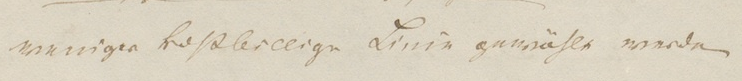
weniger kostbillige Linie gewählt werden
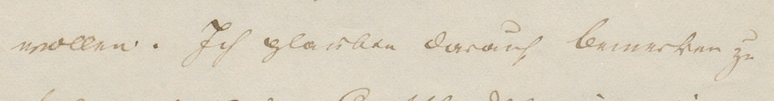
wollen. Ich glaubte darauf bemerken zu
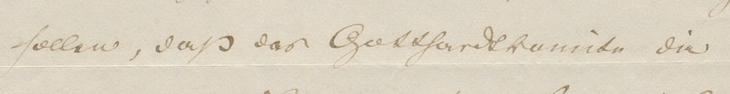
sollen, daß das Gotthardtkomite die
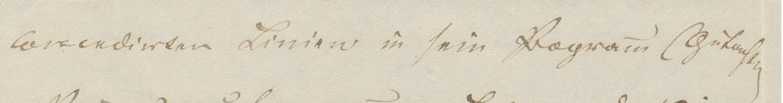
concedirten Linien in sein Programm (Gutachten
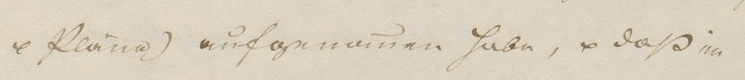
& Pläne) aufgenommen habe, & daß im
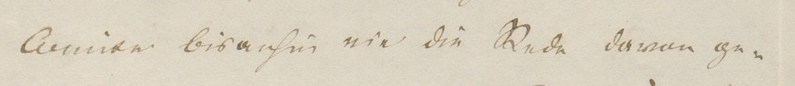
Comite bisanhin nie die Rede davon ge-
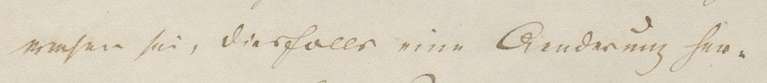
wesen sei, diesfalls eine Aenderung her-
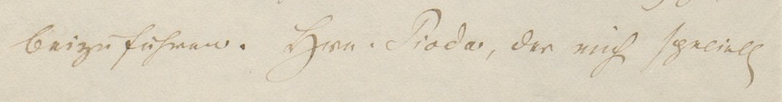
beizuführen. Hrn. Pioda, der mich speciell
